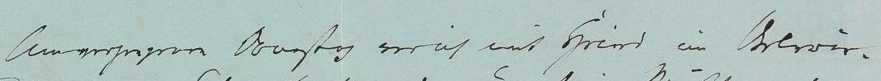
Am vergangenen Dienstag war ich mit Heini im Belvoir.
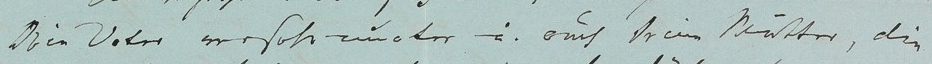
Dein Vater war sehr munter u. auch Deine Mutter, die
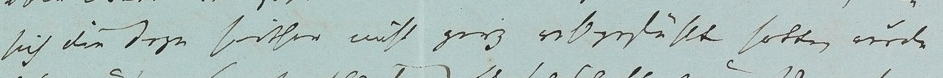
sich die Tage seither nicht ganz wohl gefühlt hatte, wurde
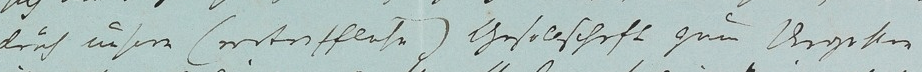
durch unsere (vortreffliche) Gesellschaft zum Vergessen
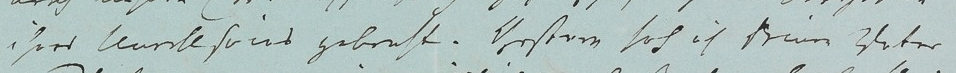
ihres Unwohlseins gebracht. Gestern sah ich Deinen Vater
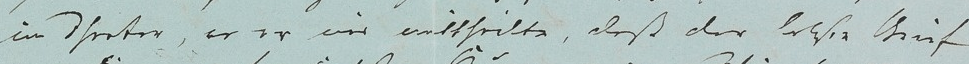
im Theater, wo er mir mittheilte, daß der letzte Brief
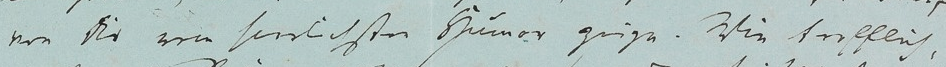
von Dir vom herrlichsten Humor zeuge. Wie trefflich,
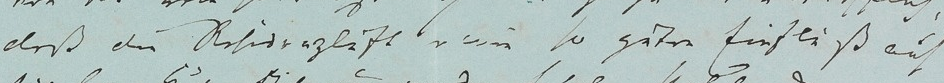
daß die Residenzluft einen so guten Einfluß auf
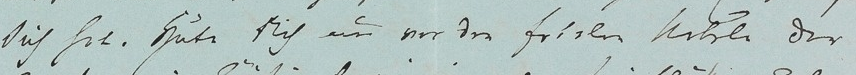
Dich hat. Hüte Dich nur vor den fatalen Nebeln der
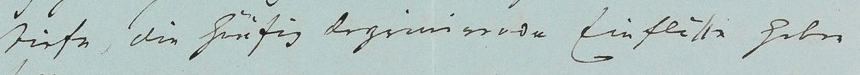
Tiefe, die häufig deprimirende Einflüsse haben
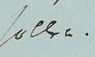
sollen.
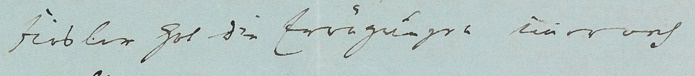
Finsler hat die Erwägungen immer noch
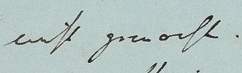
nicht gemacht.
